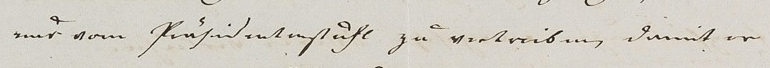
nur vom Präsidentenstuhl zu vertreiben, damit er
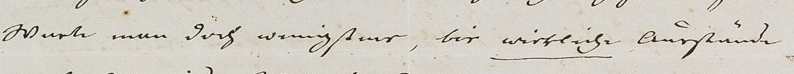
Warte man doch wenigstens, bis wirkliche Ausstände
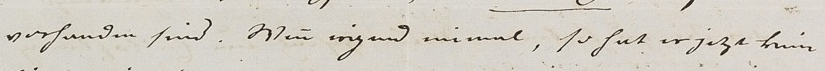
vorhanden sind. Wenn irgend einmal, so hat es jetzt keine
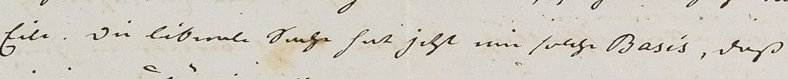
Eile. Die liberale Sache hat jetzt eine solche Basis, daß
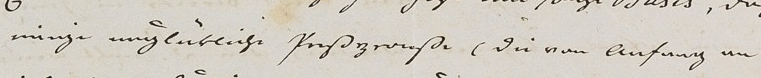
einige unglükliche Preßproceße (die von Anfang an
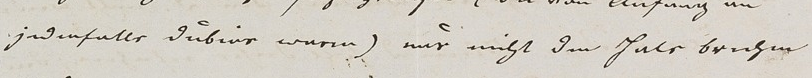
jedenfalls dubios waren) uns nicht den Hals brechen
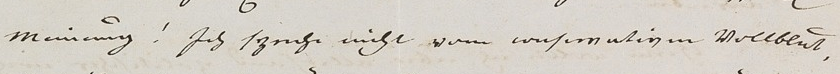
Meinung! Ich spreche nicht vom conservativen Vollblut,
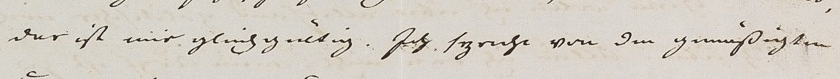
das ist mir gleichgültig. Ich spreche von den gemäßigten
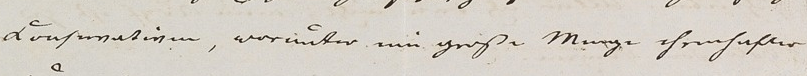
Conservativen, worunter eine große Menge ehrenhafter
